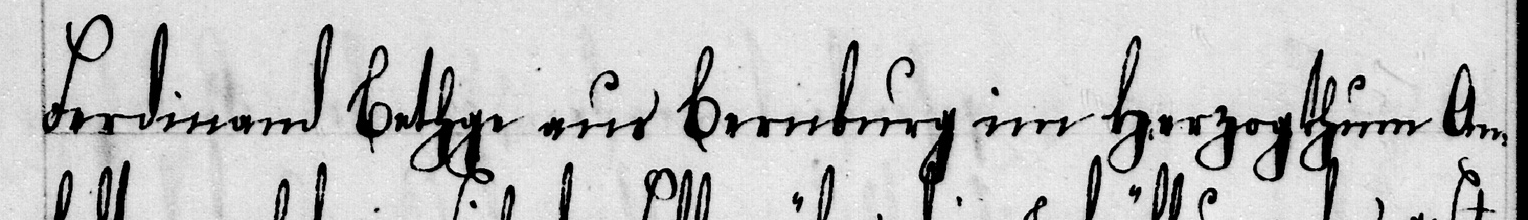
Ferdinand Bethge aus Bernburg im Herzogthum An¬
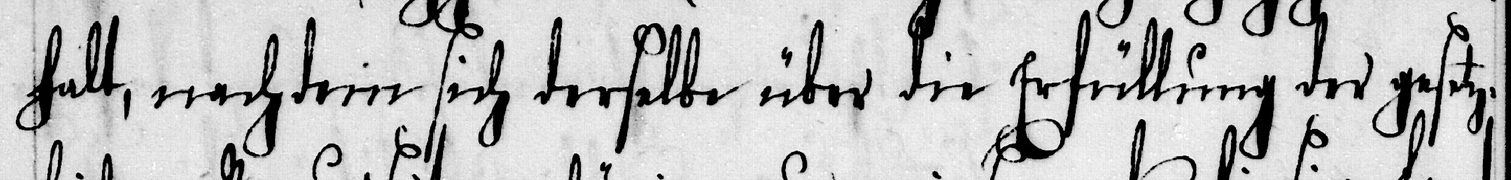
halt, nachdem sich derselbe über die Erfüllung der geset¬
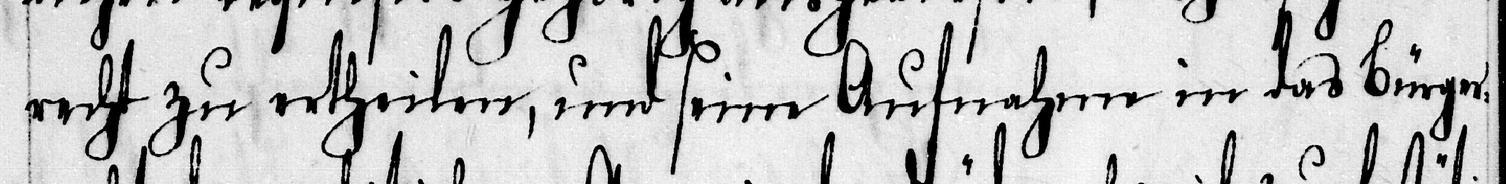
recht zu ertheilen, und seine Aufnahme in das Bürger¬
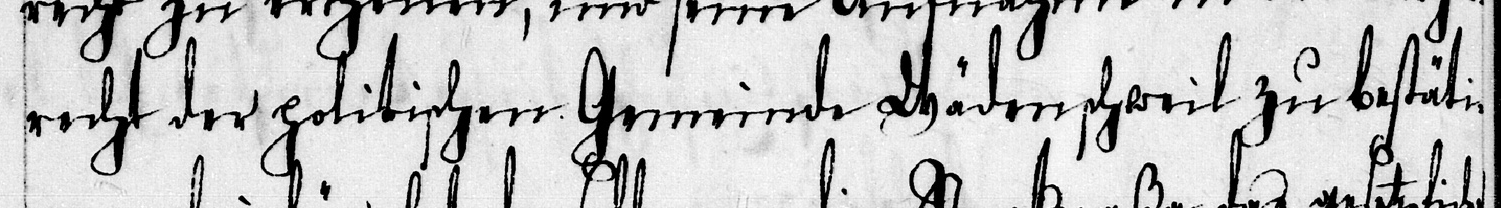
recht der politischen Gemeinde Wädenschweil zu bestäti¬
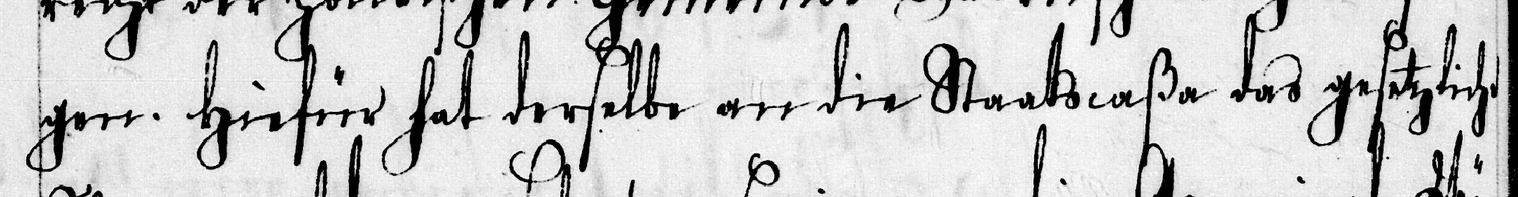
gen. Hiefür hat derselbe an die Staatscaßa das gesetzlic¬
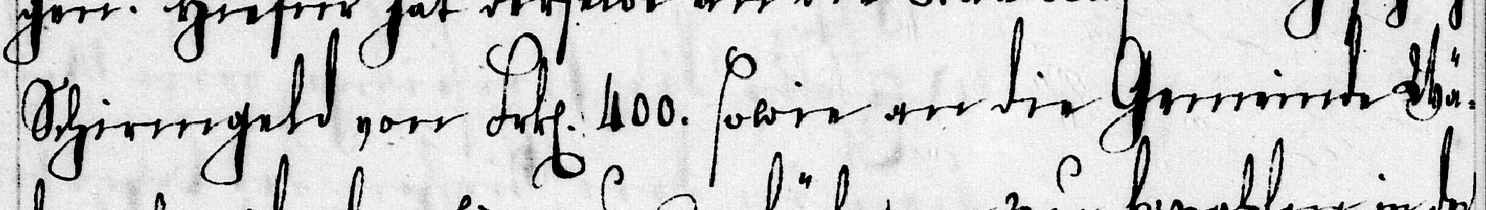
Schirmgeld von Frk[en]. 400. sowie an die Gemeinde Wä¬
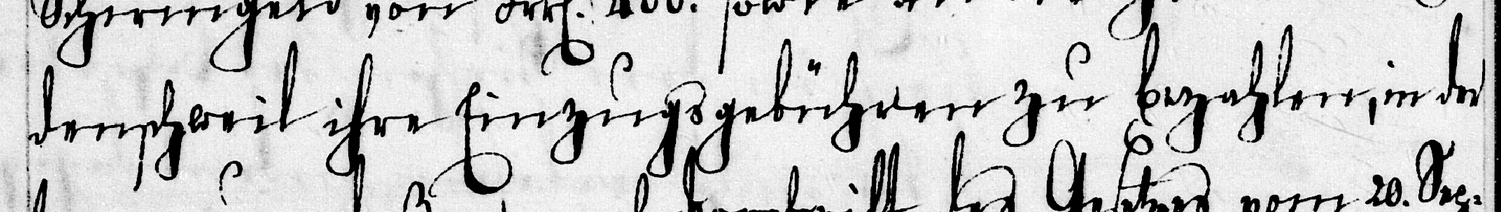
denschweil ihre Einzugsgebühren zu bezahlen, in der
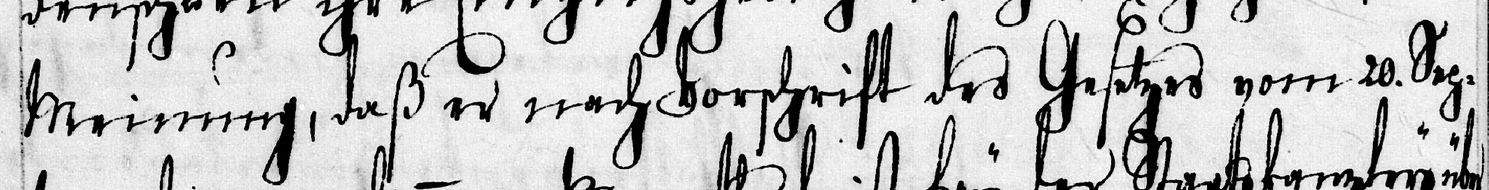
Meinung, daß er nach Vorschrift des Gesetzes vom 20. Sep¬
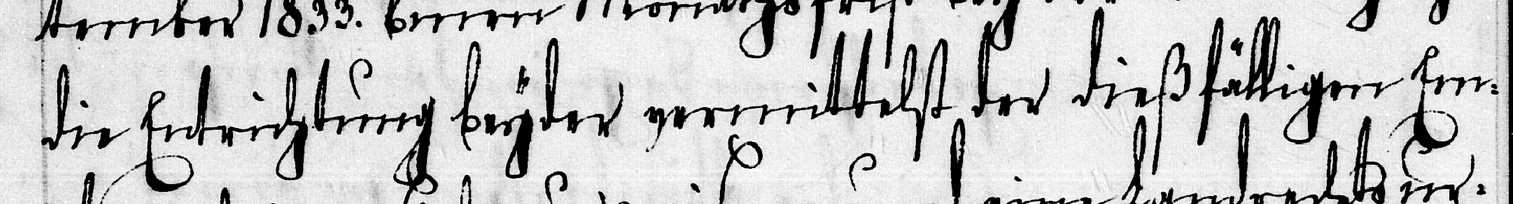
die Entrichtung beyder vermittelst der dießfälligen Em¬
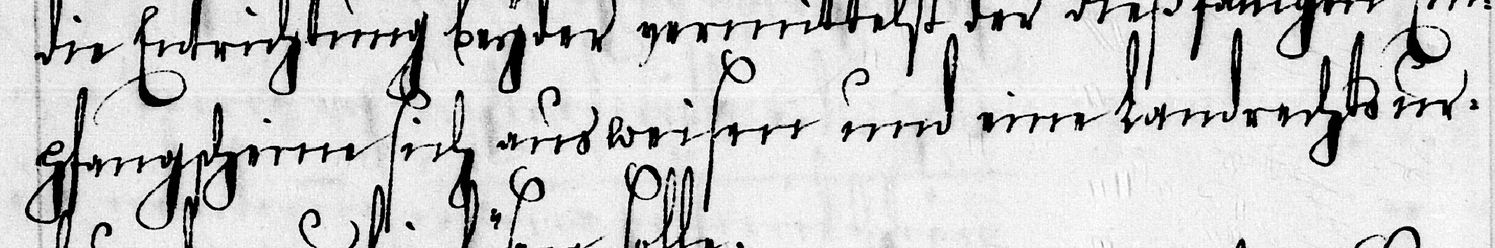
pfangscheine sich ausweisen und eine Landrechtsur¬
